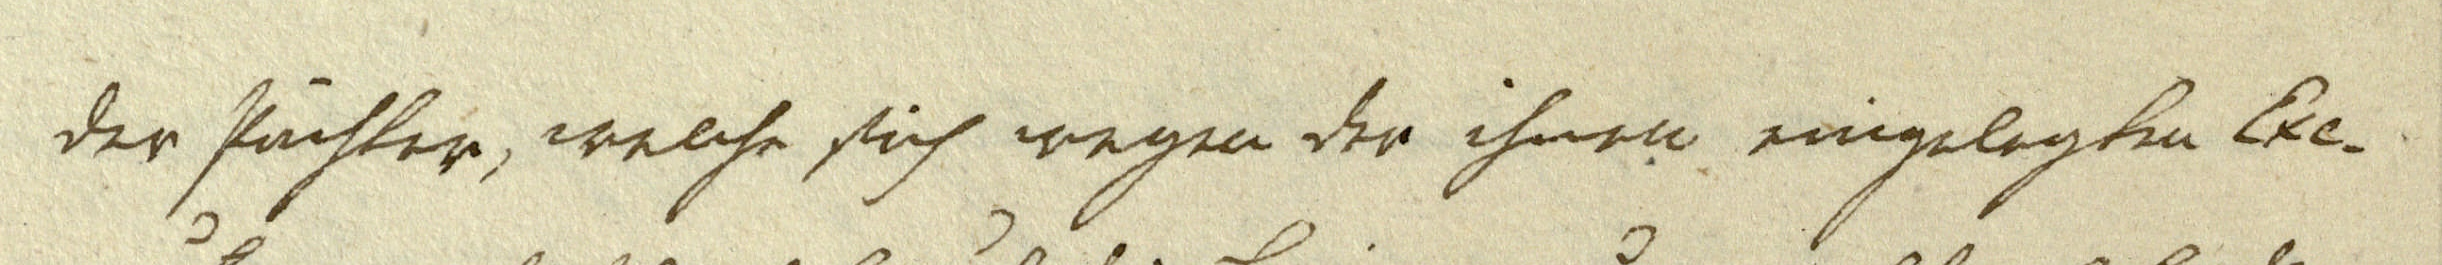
der Pächter, welche sich wegen der ihnen eingelegten Exe¬
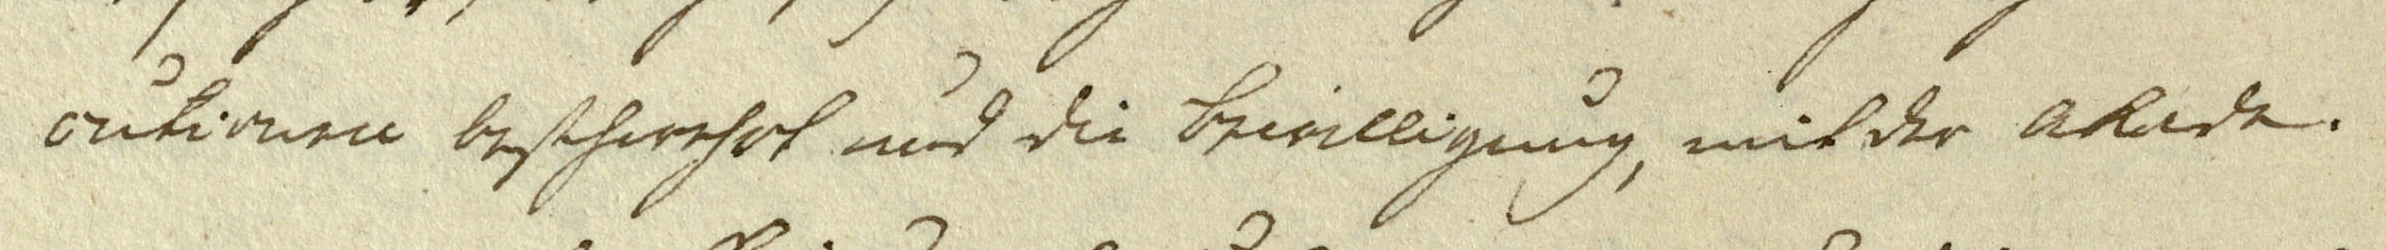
cutionen beschwehrt und die Bewilligung, mit der Akade¬
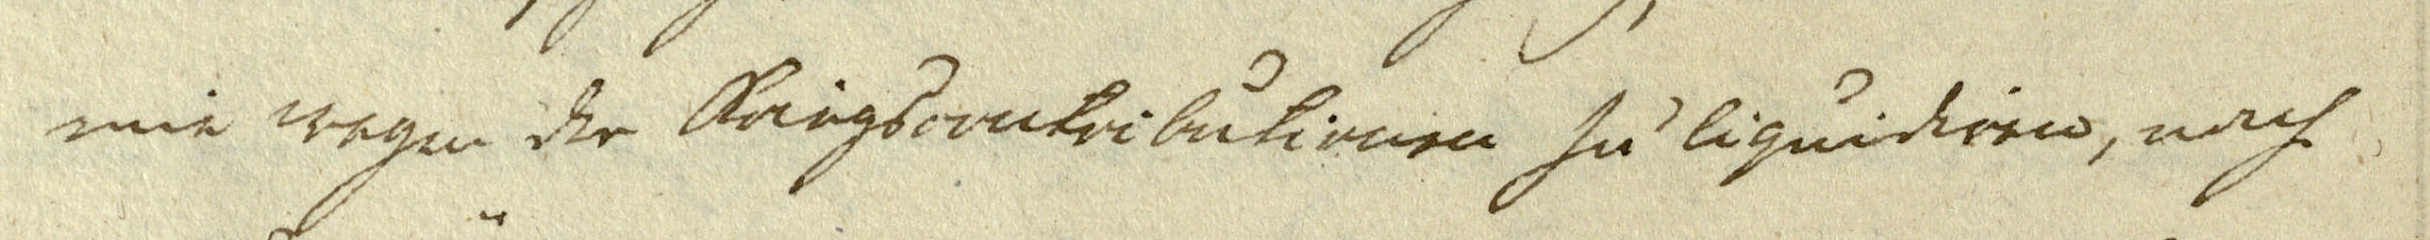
mie wegen der Kriegscontributionen zu liquidiren, nach¬
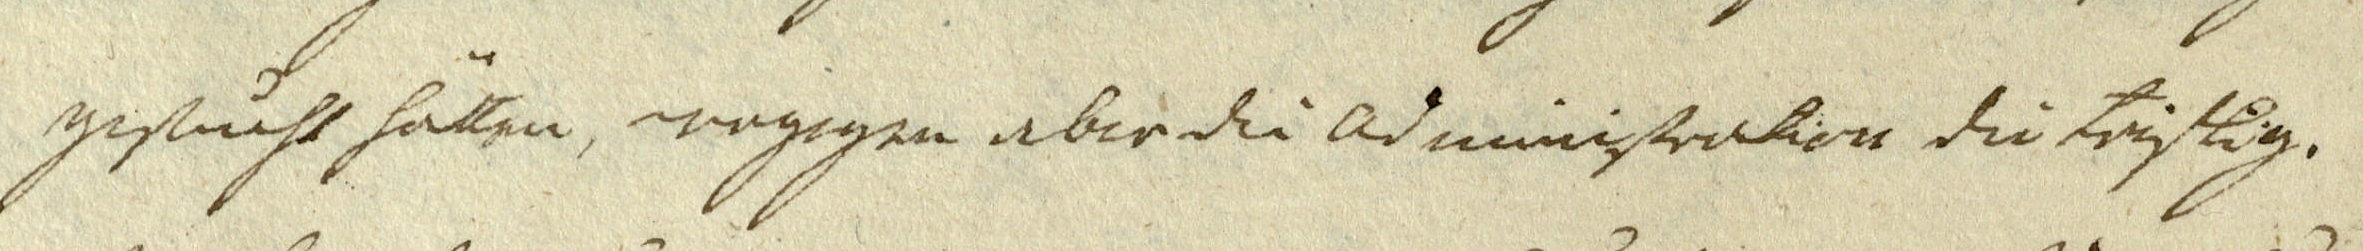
gesucht hätten, wogegen aber die Administration die triftig¬
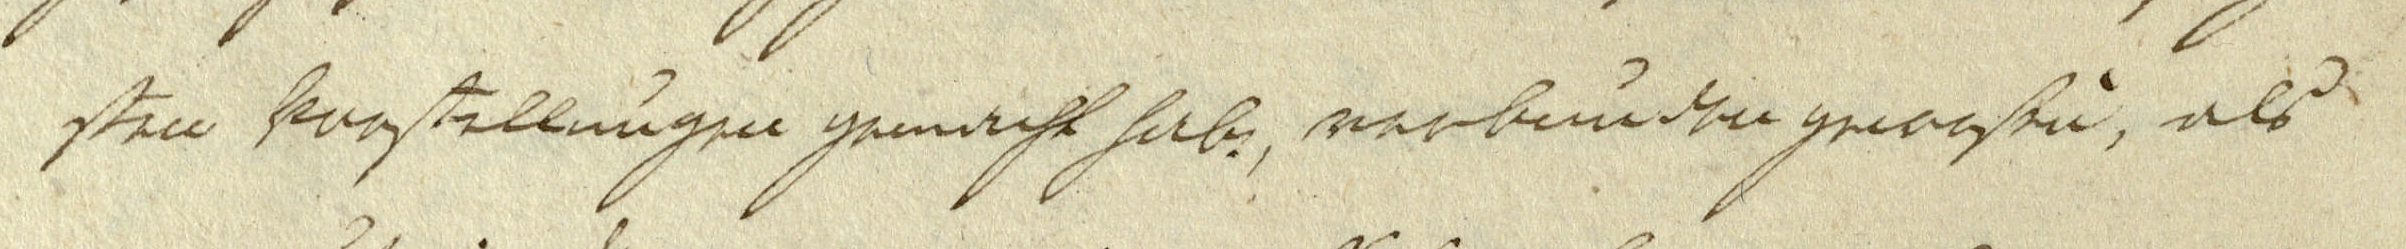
sten Vorstellungen gemacht habe, verbunden gewesen, als
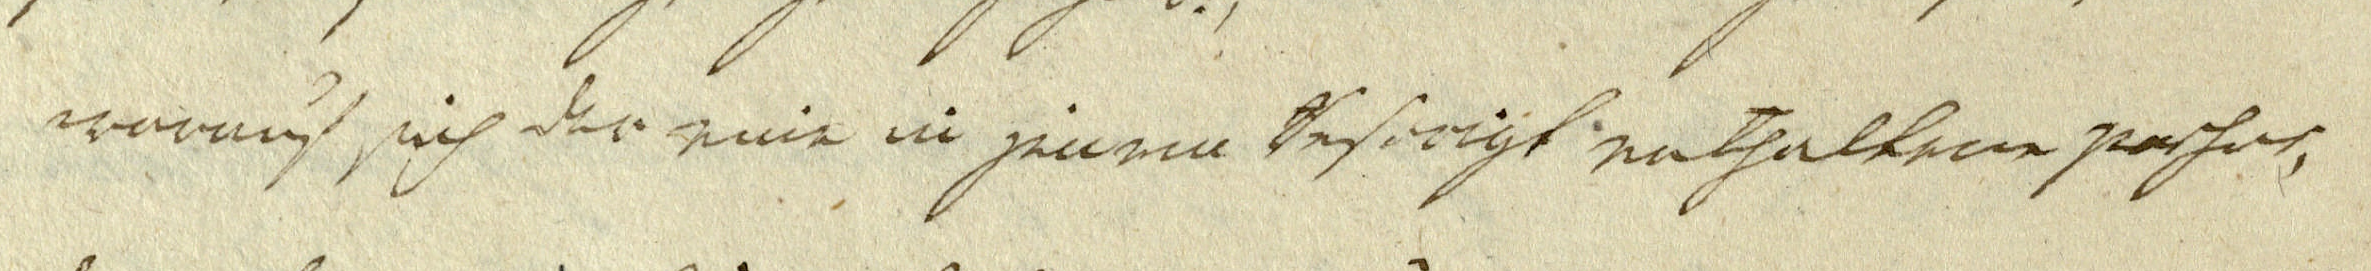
worauf sich der eine in jenem Rescript enthaltene passus,
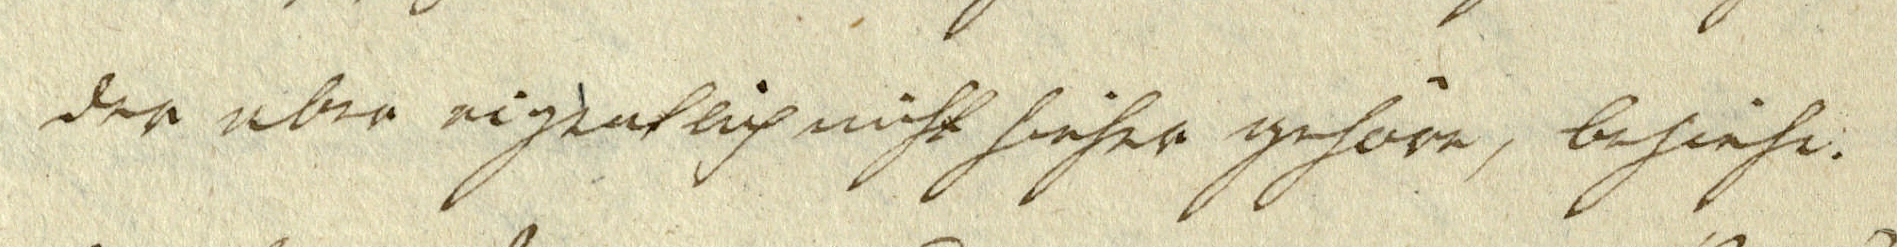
der aber eigentlich nicht hieher gehöre, beziehe.
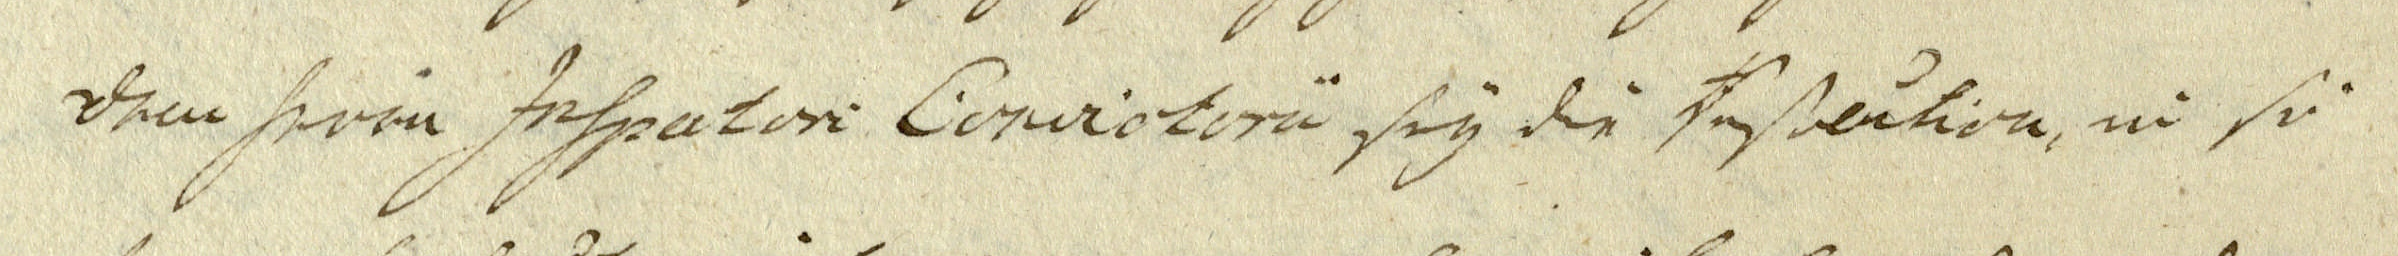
Dem Herrn Inspectore Convictorii seÿ die Resolution, in so
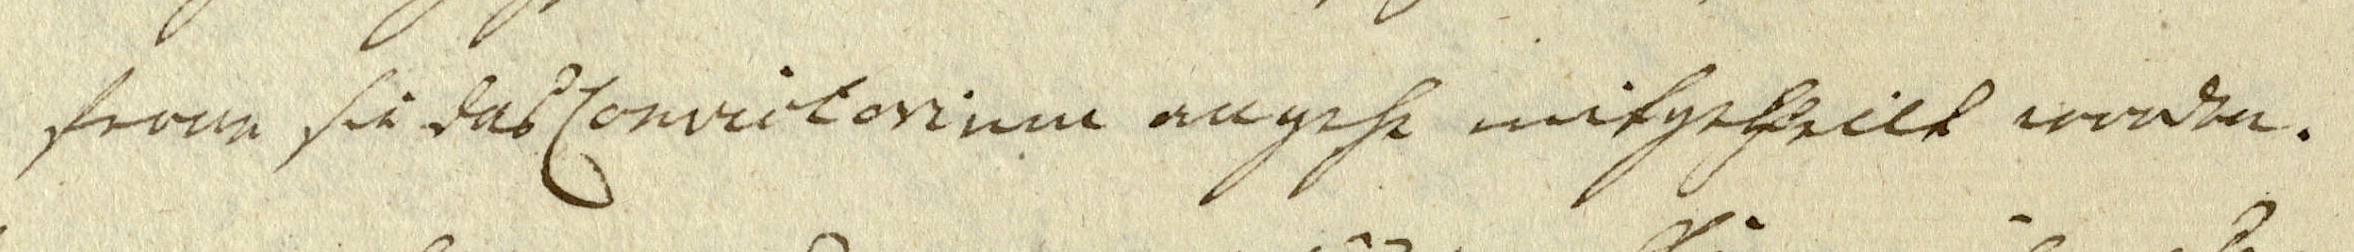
ferne sie das Convictorium angehe mitgetheilt worden.
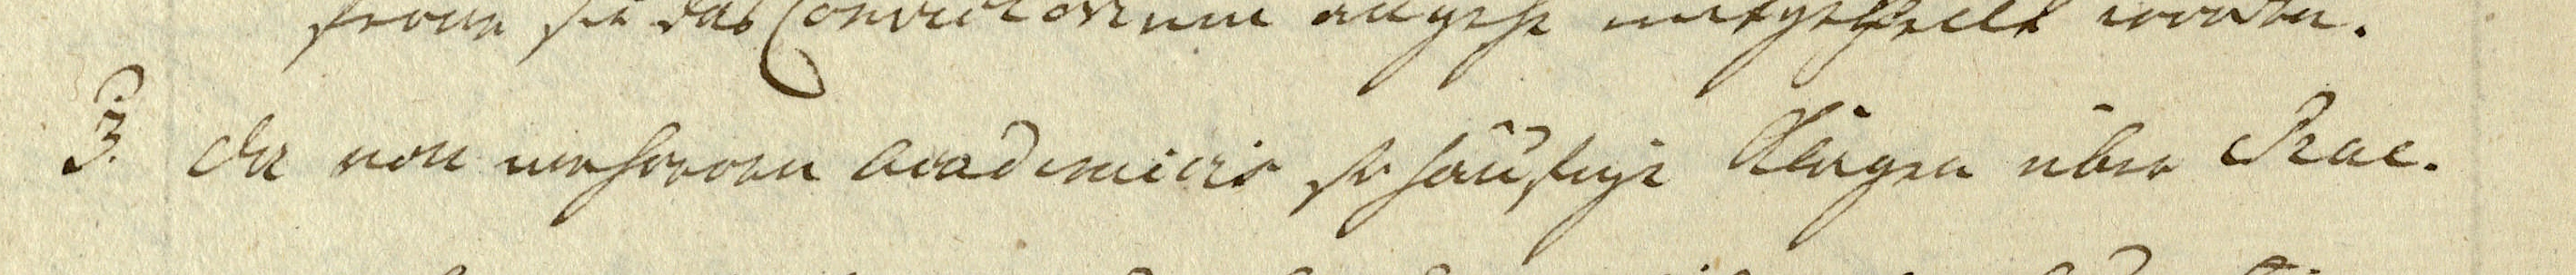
3. Da von mehreren Academicis so häufige Klagen über Prae¬
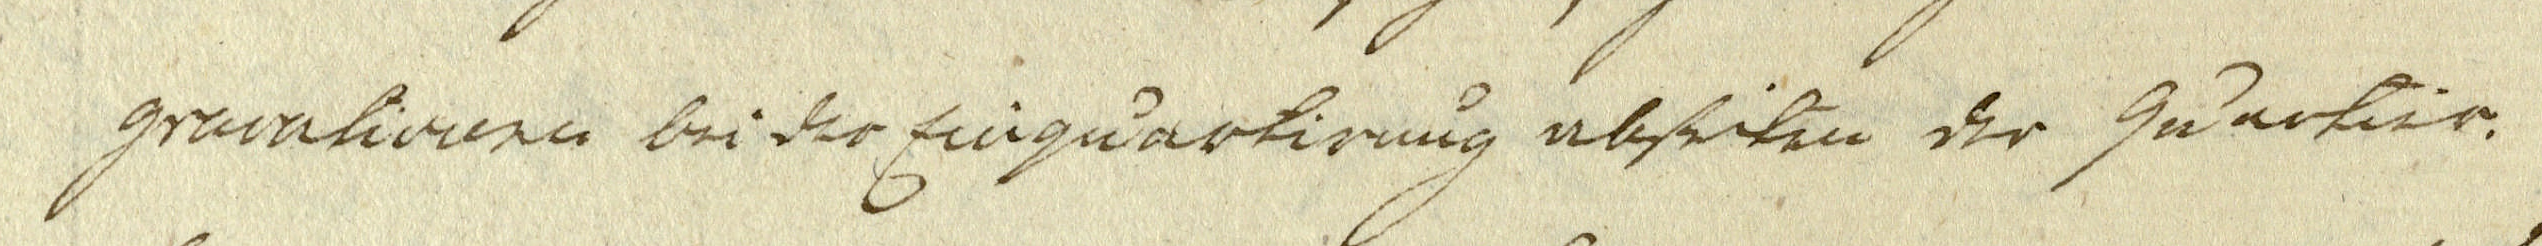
gravationen bei der Einquartirung abseiten der Quartier¬
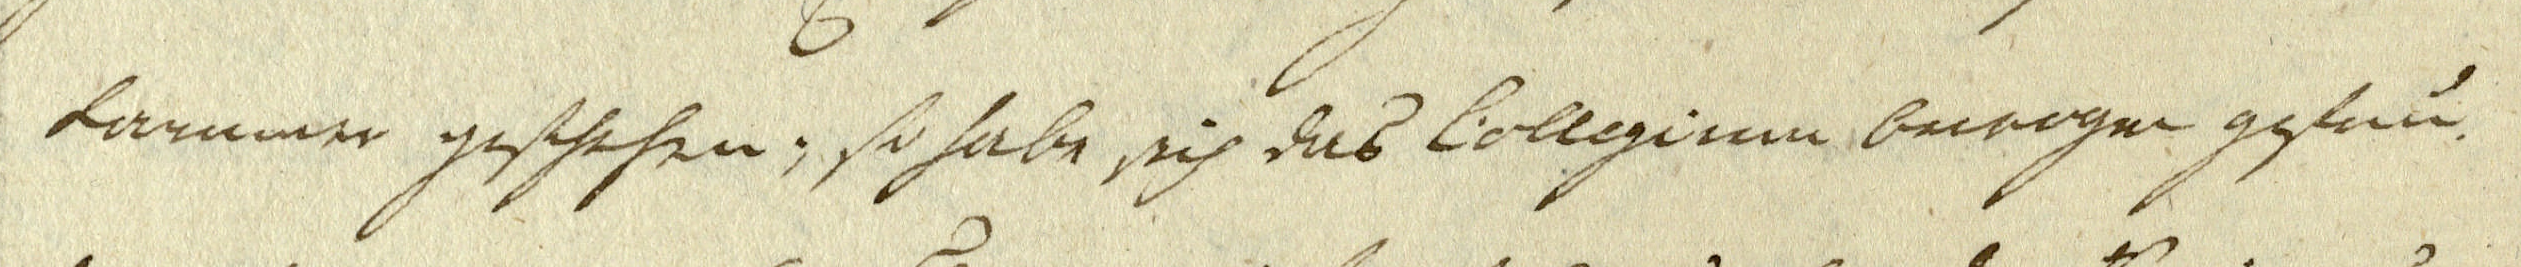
kammer geschehen, so habe sich das Collegium bewogen gefun¬
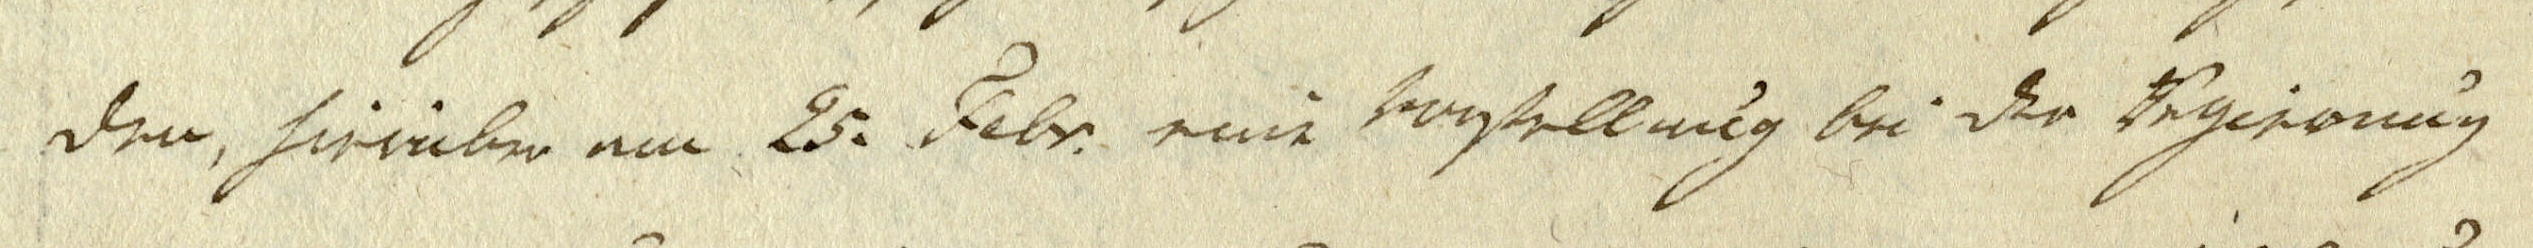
den, hierüber am 25. Febr. eine Vorstellung bei der Regierung
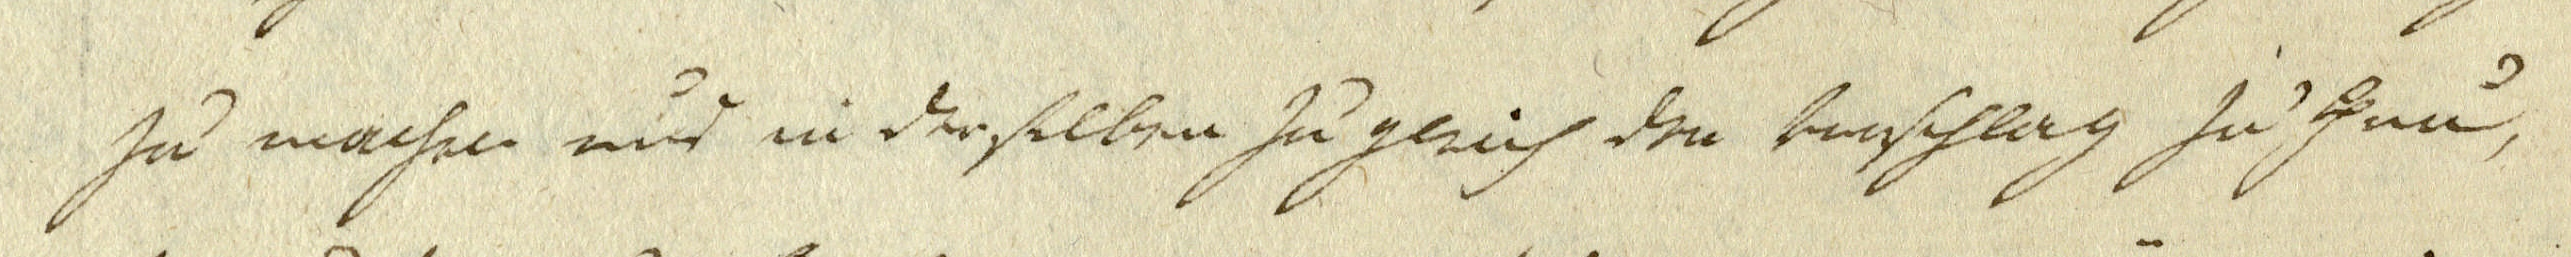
zu machen und in derselben zu gleich den Vorschlag zu thun,
